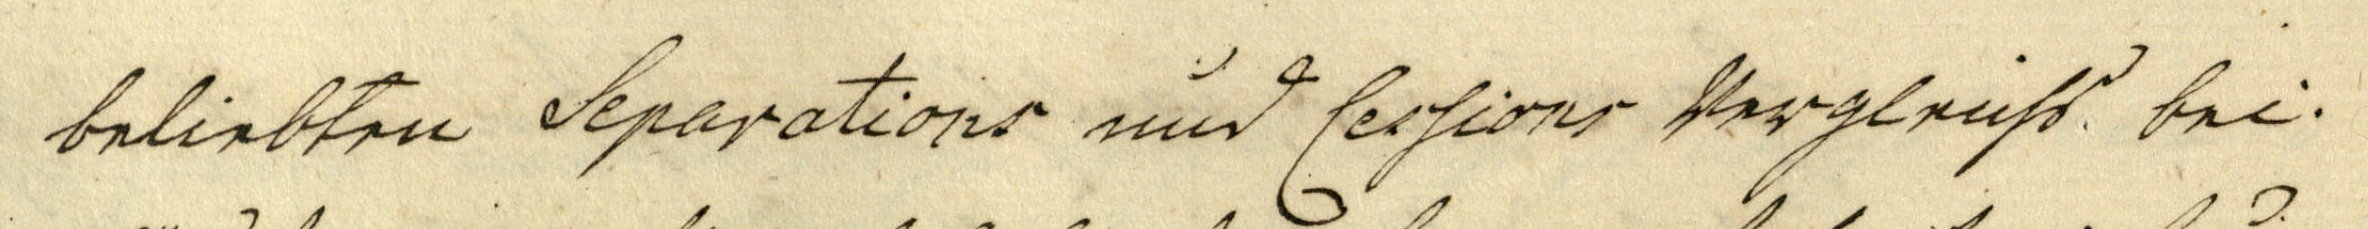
beliebten Separations und Cessions Vergleichs bei-
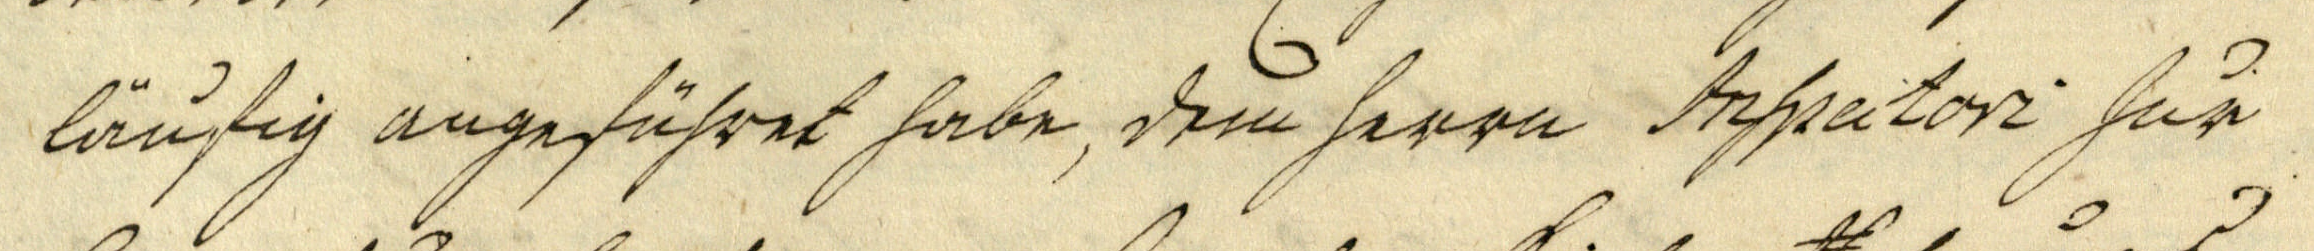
läufig angeführet habe, dem herrn Inspectori zur
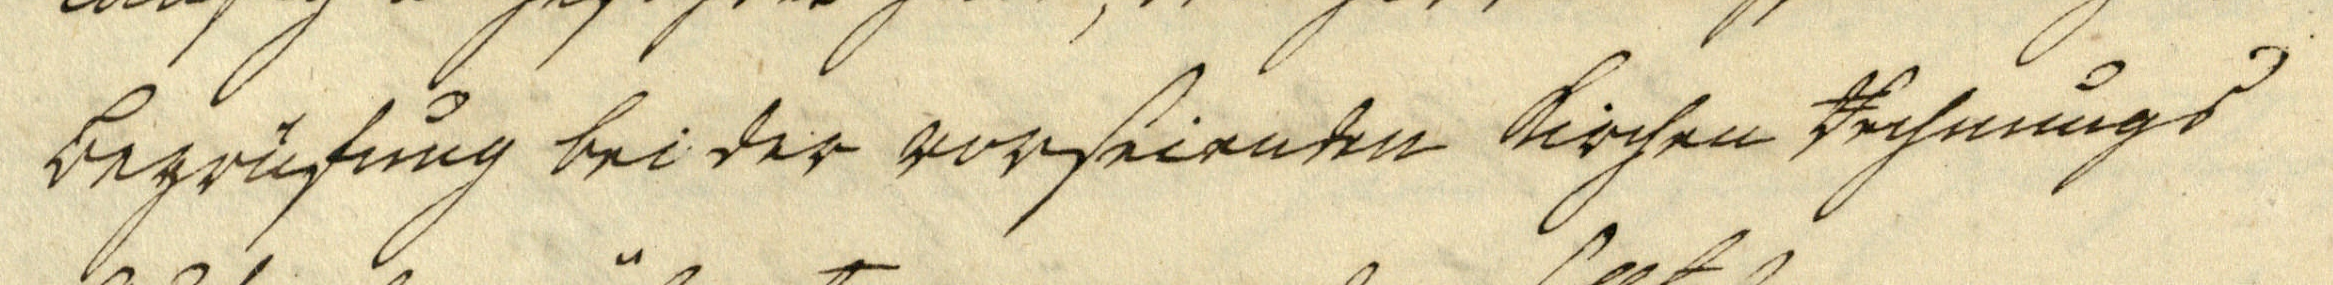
Berüfung bei der vorseienden Kirchen Rechnungs
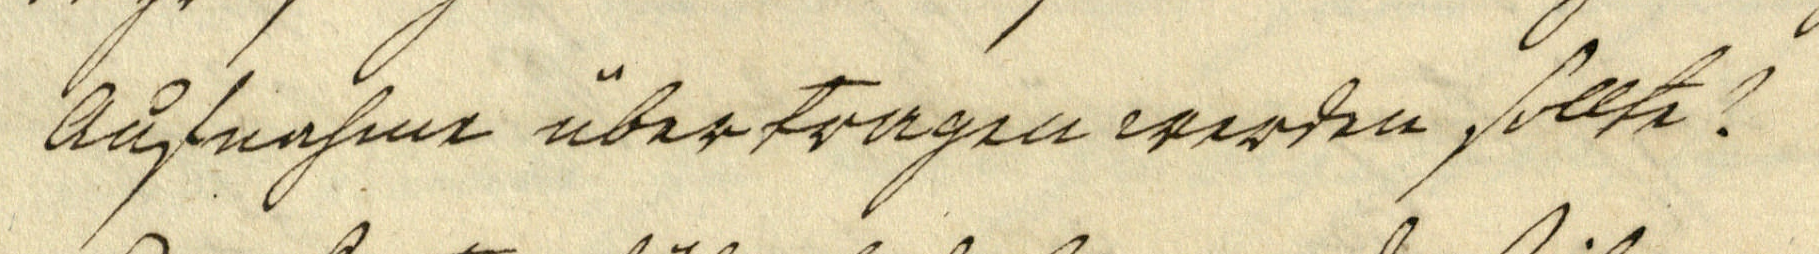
Aufnahme übertragen werden sollte?
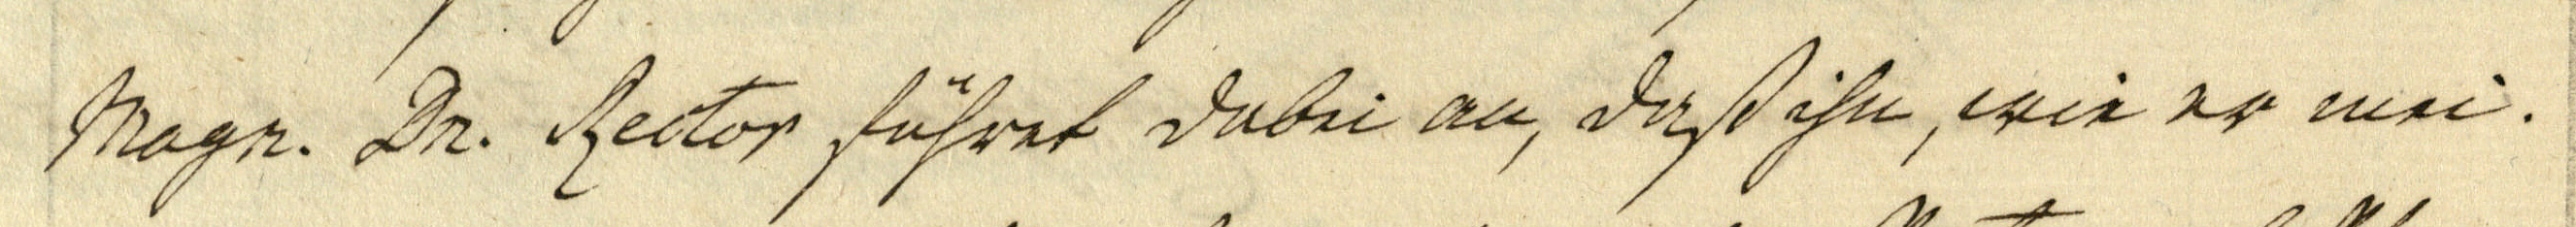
Magn. Dn. Rector führet dabei an, daß ihn, wie er mei-
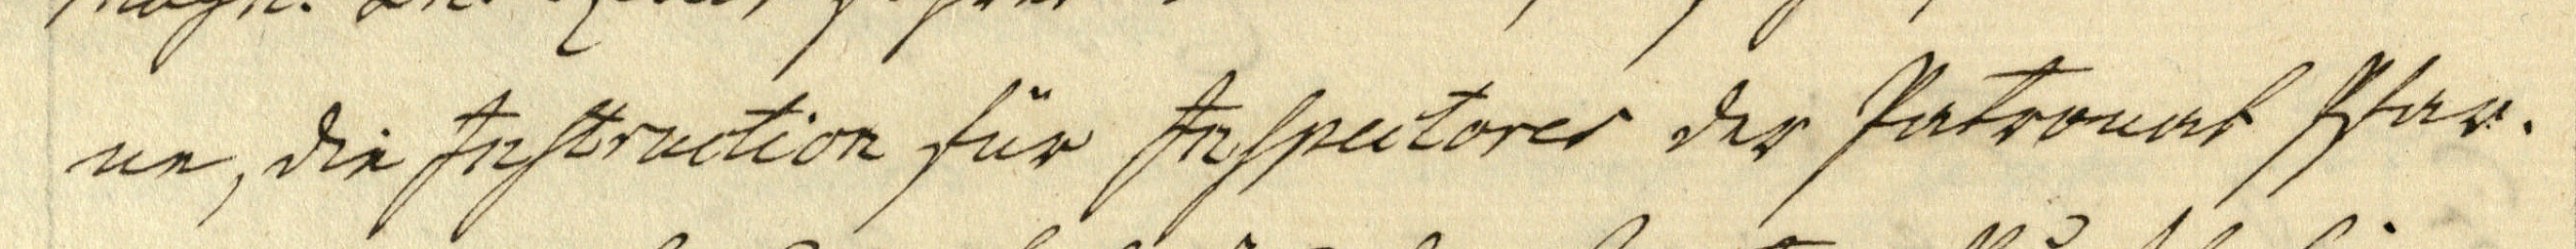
ne, die Instruction für Inspectores der Patronat Pfar-
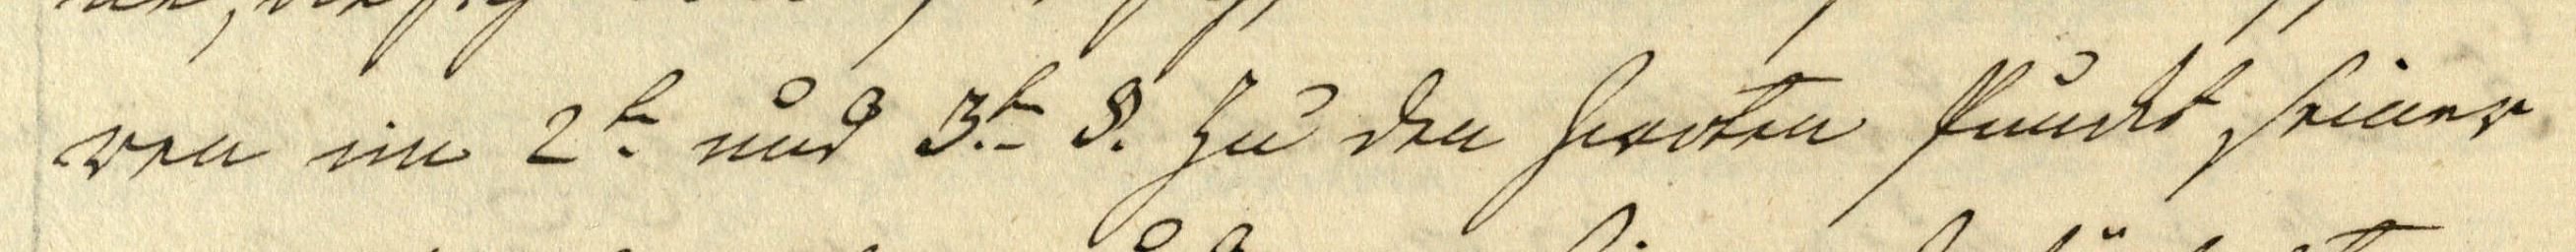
ren im 2ten und 3ten §. zu den zwoten Punkt seiner
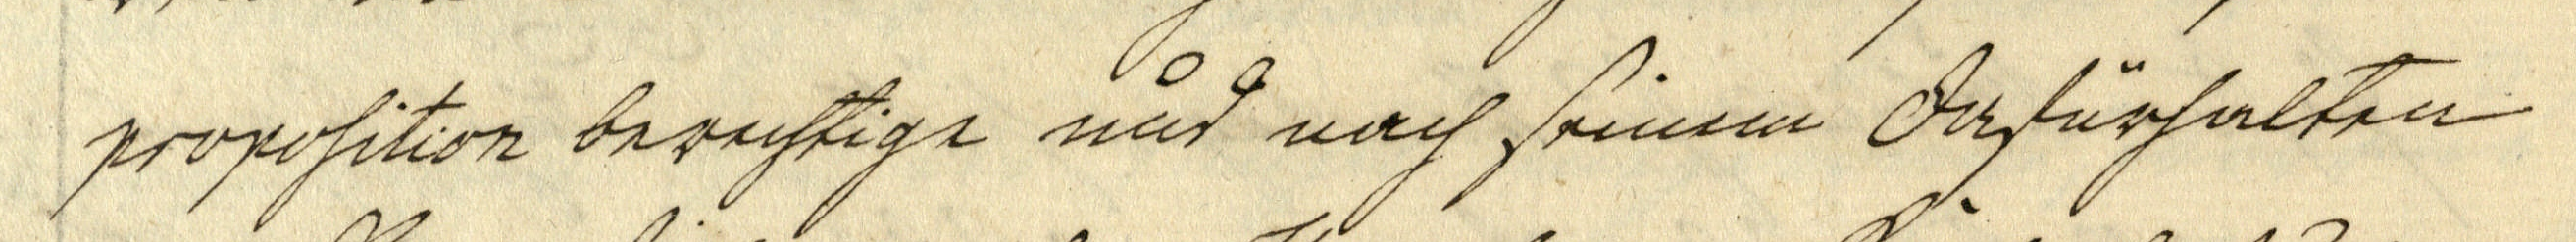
proposition berechtige und nach seinem Dafürhalten
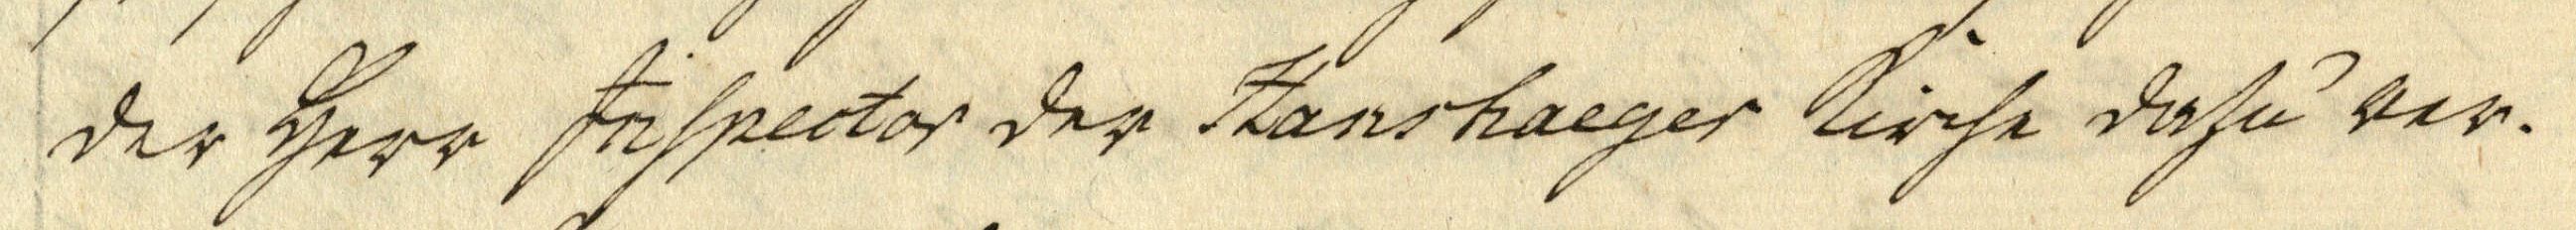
der Herr Inspector der Hanshaeger Kirche dazu ver-
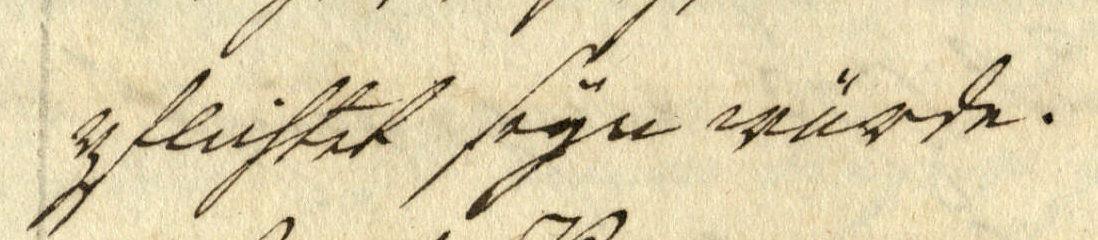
pflichtet seyn würde.
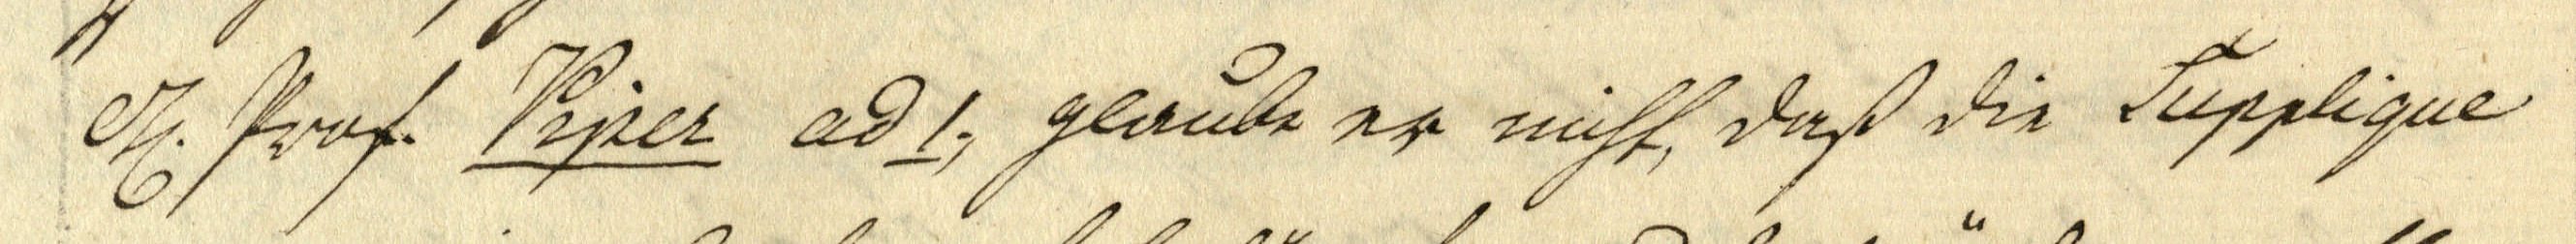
dh. Prof. Piper ad 1., glaube er nicht, daß die Supplique
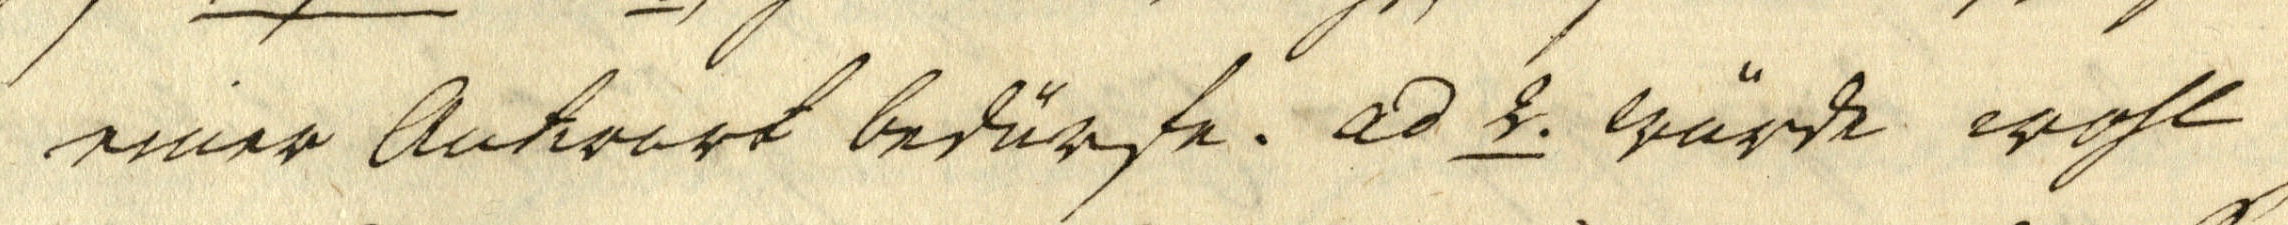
einer Antwort bedürfe. Ad 2. würde wohl
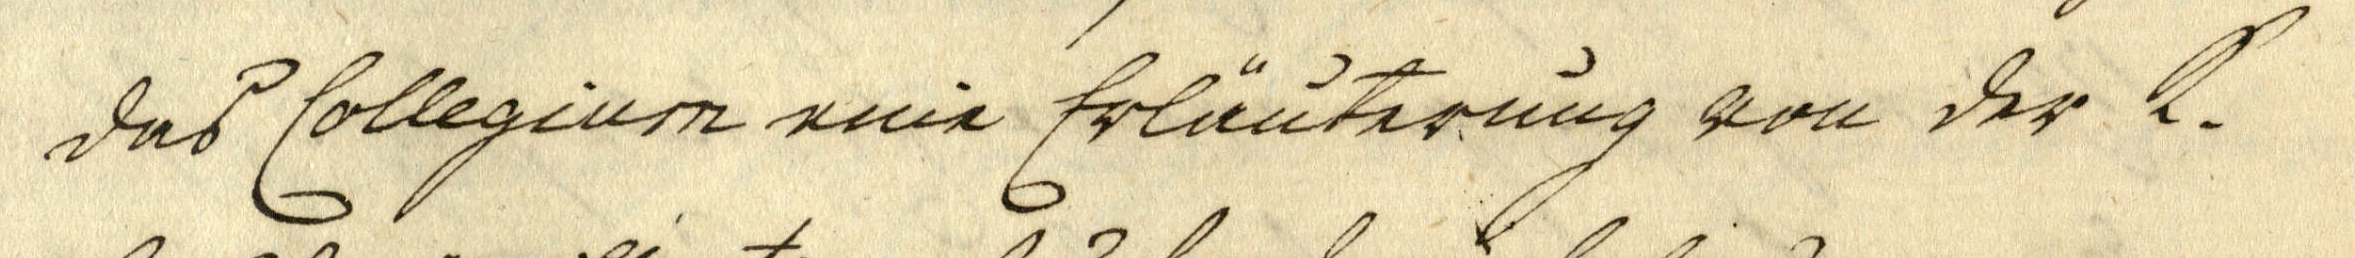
das Collegium eine Erläuterung von der K.
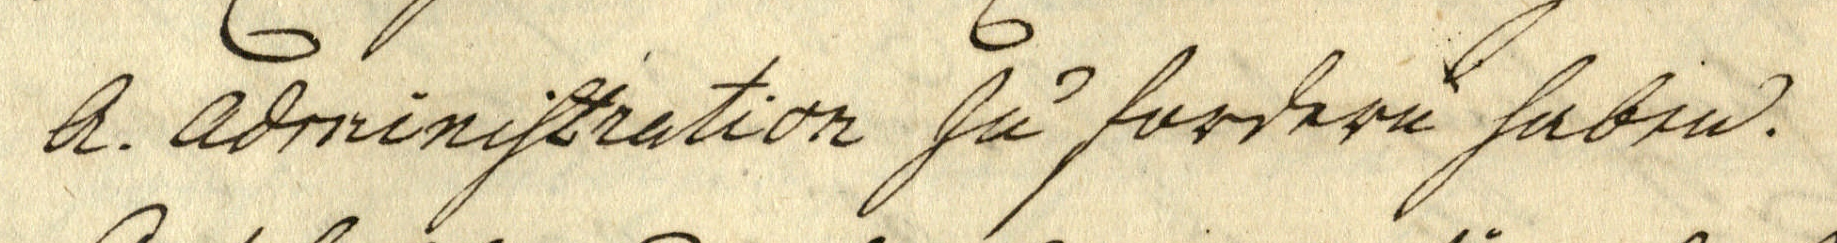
A. Administration zu fordern haben.
